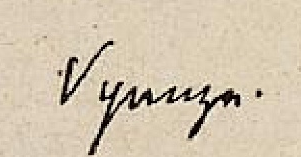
V ganze.
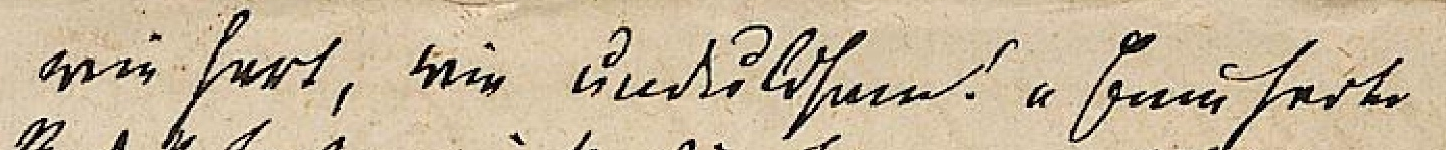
wie hart, wie unduldsam! "Eine harte
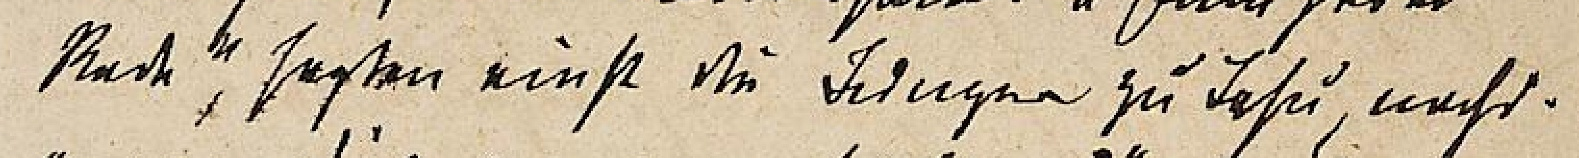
Rede," sagten einst die Jünger zu Jesu, nachd.
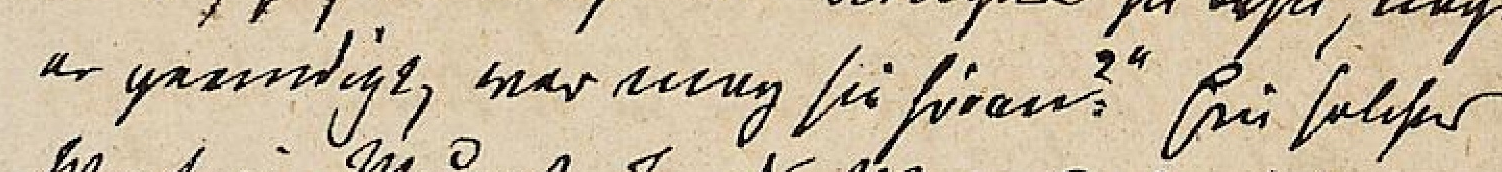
er geendigt, wer mag sie hören?" Ein solches
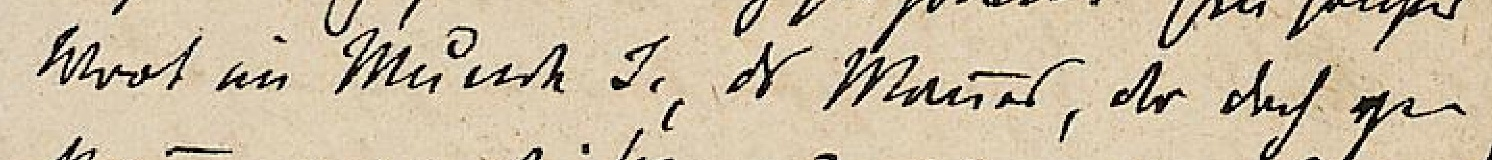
Wort im Munde J., ds Manes, dr doch ge¬
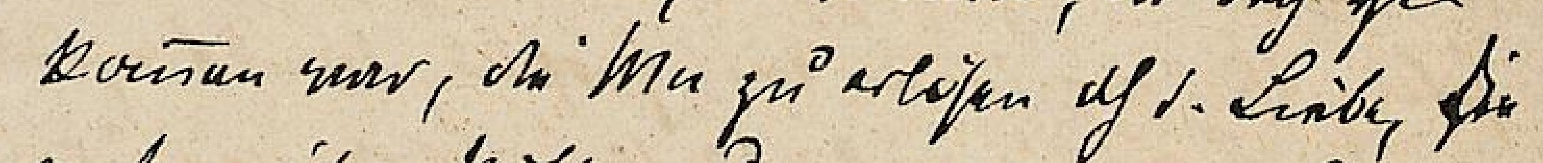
komen war, die Mn zu erlösen dch d. Liebe, die
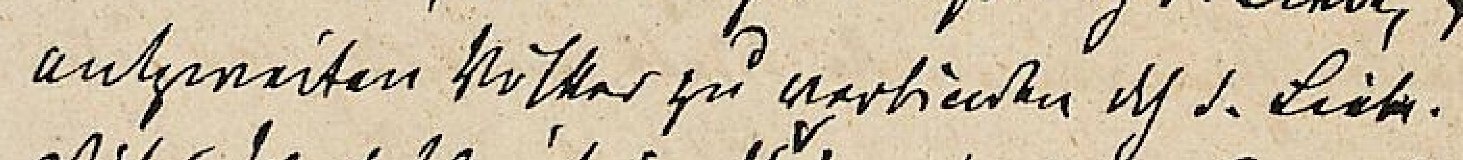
entzweiten Völker zu verbinden dch die Liebe.
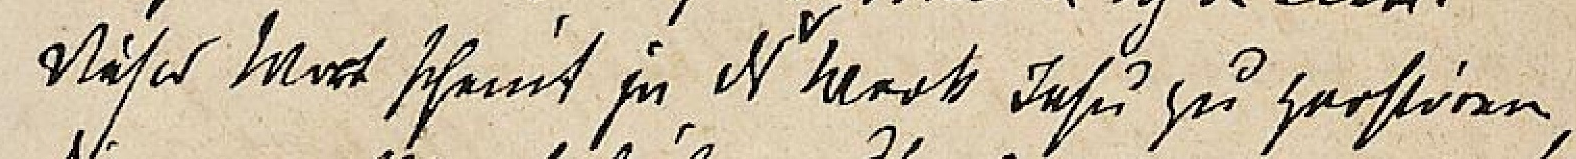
Dieses Wort scheint ja ds Werk Jesu zu zerstören,
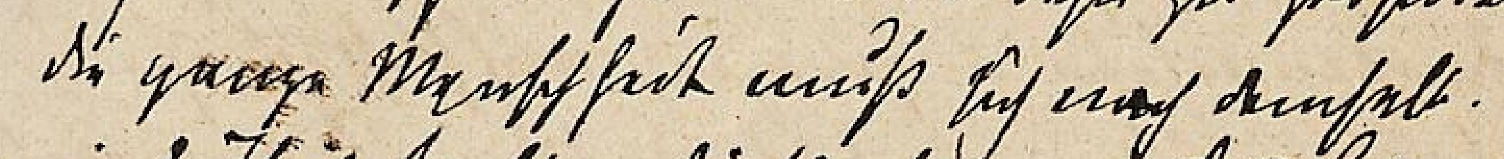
die ganze Menschheit muß sich nach demselb.
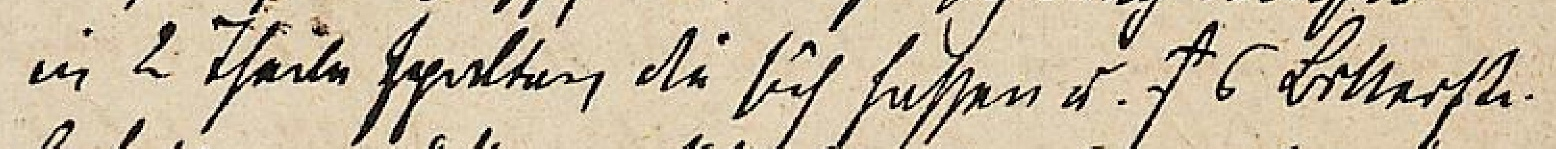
in 2 Theile spalten, die sich hassen u. f s Bitterste
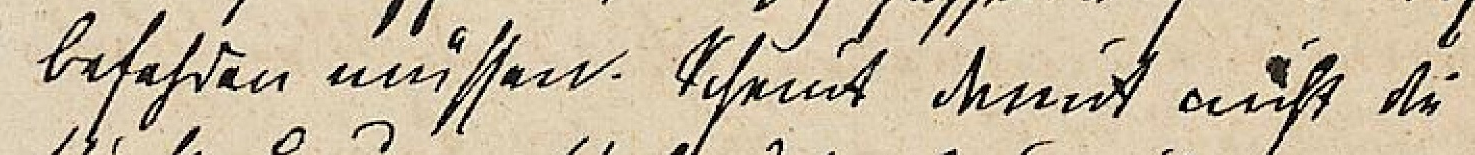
befehden müssen. Scheint damit nicht die
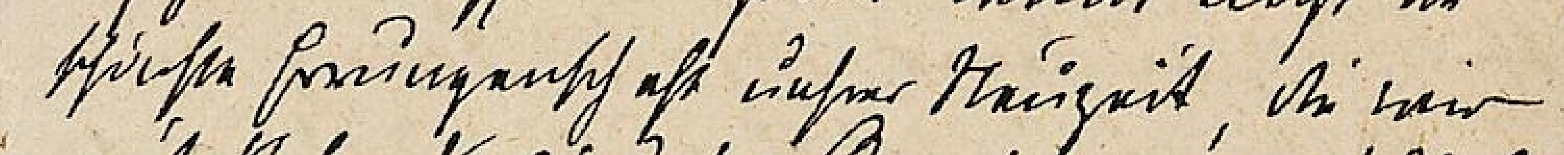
schönste Errungenschaft eht unsrer Neuzeit, die wir
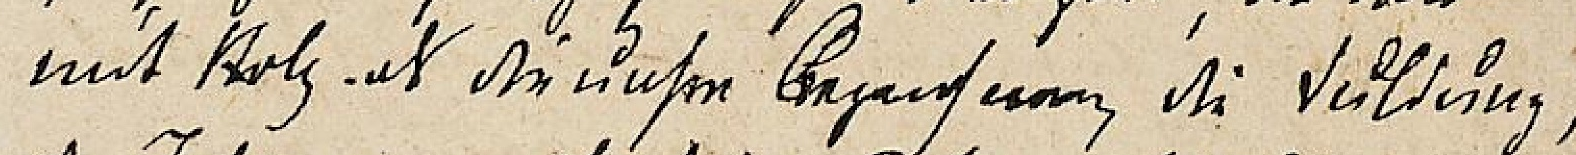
mit Stolz als die unsre bezeichnen, die Duldung,
